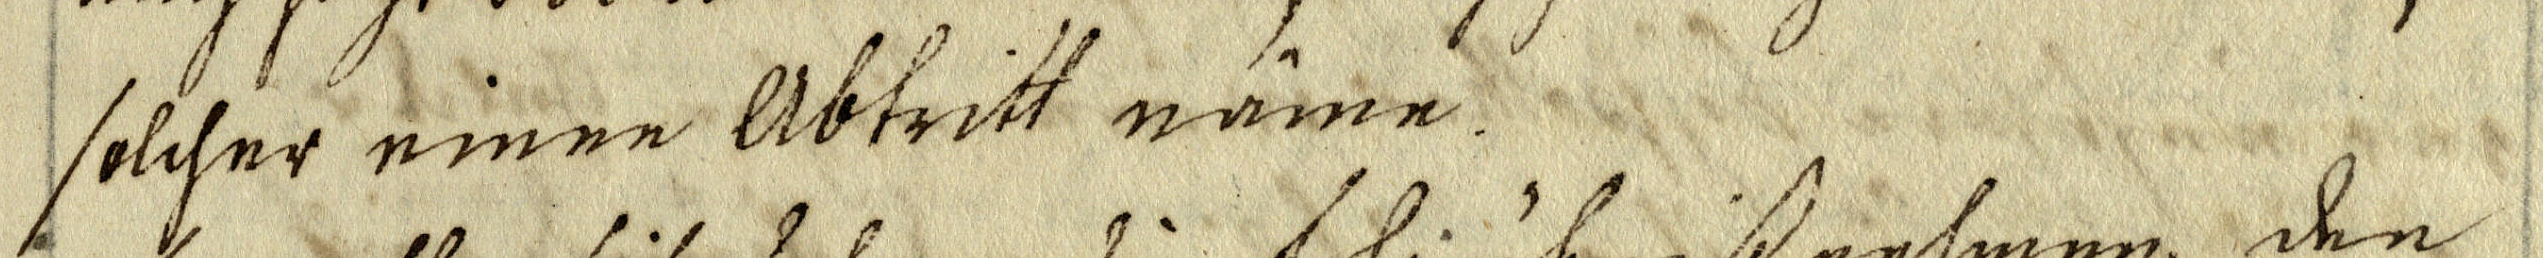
solcher einen Abtritt näme.
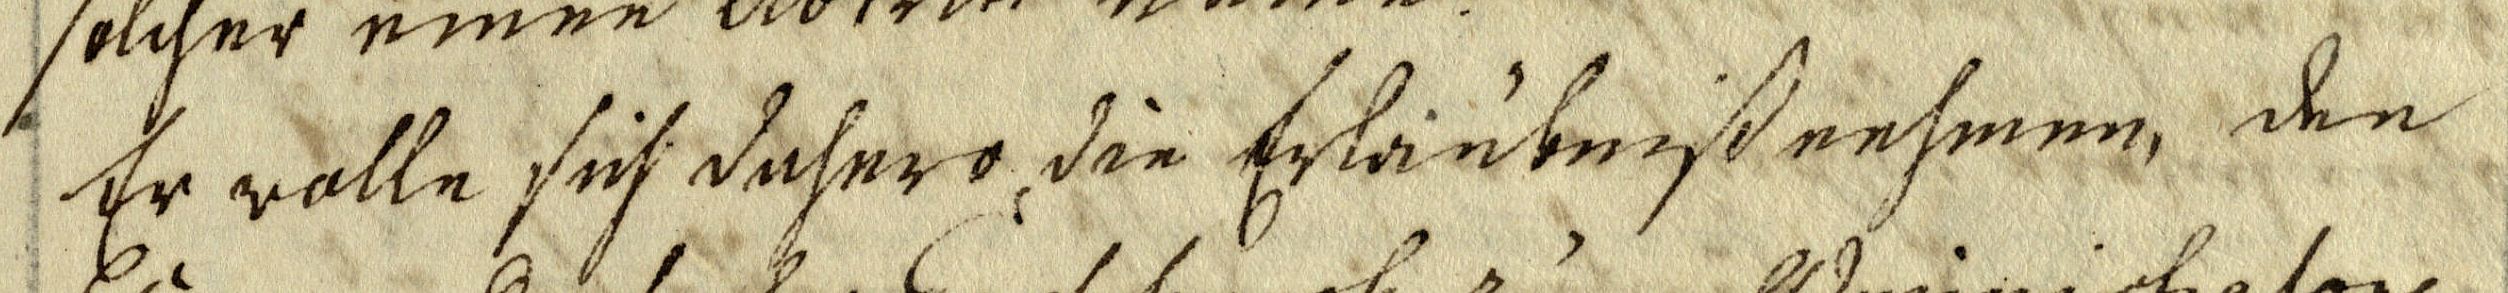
Er wolle sich dahero die Erlaubnß nehmen, den
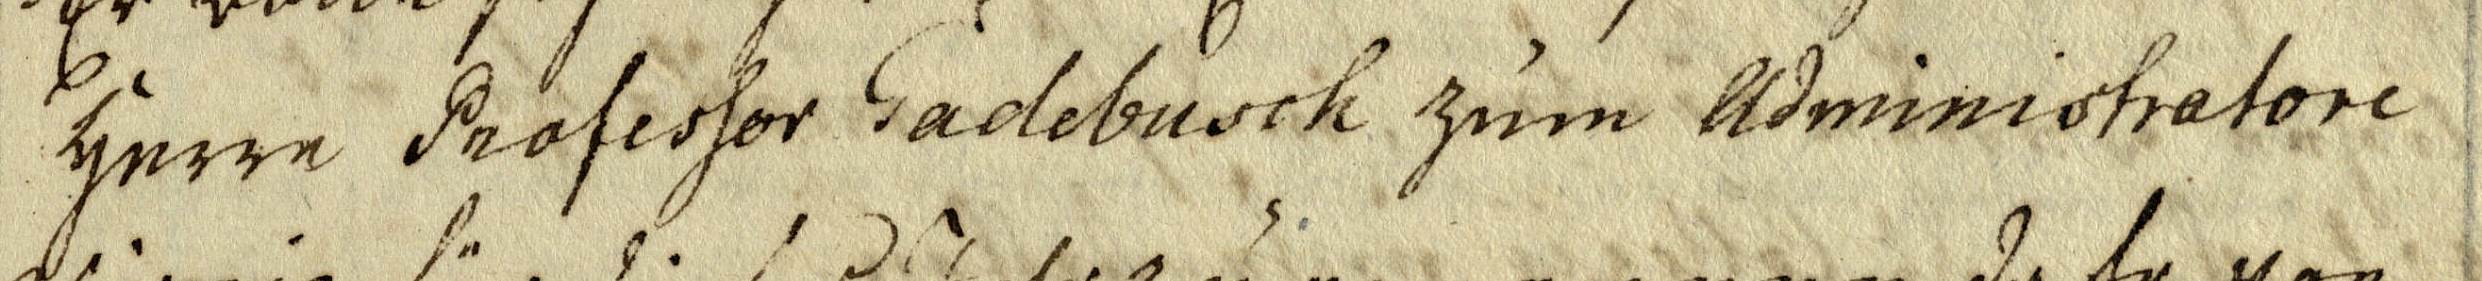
Herrn Professor Gadebusch zum Administratore
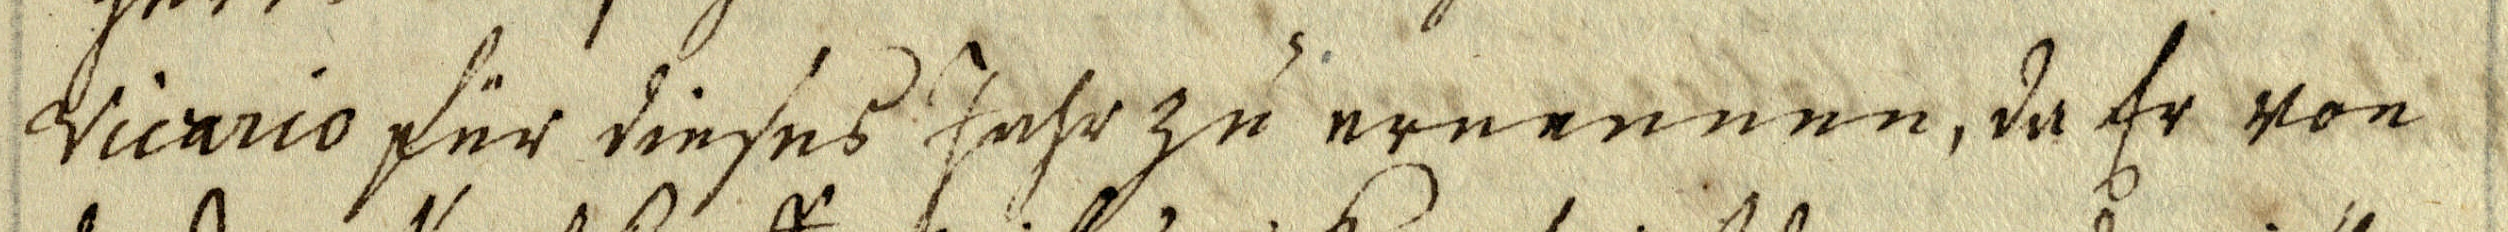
vicario für dieses Jahr zu ernennen, da Er von
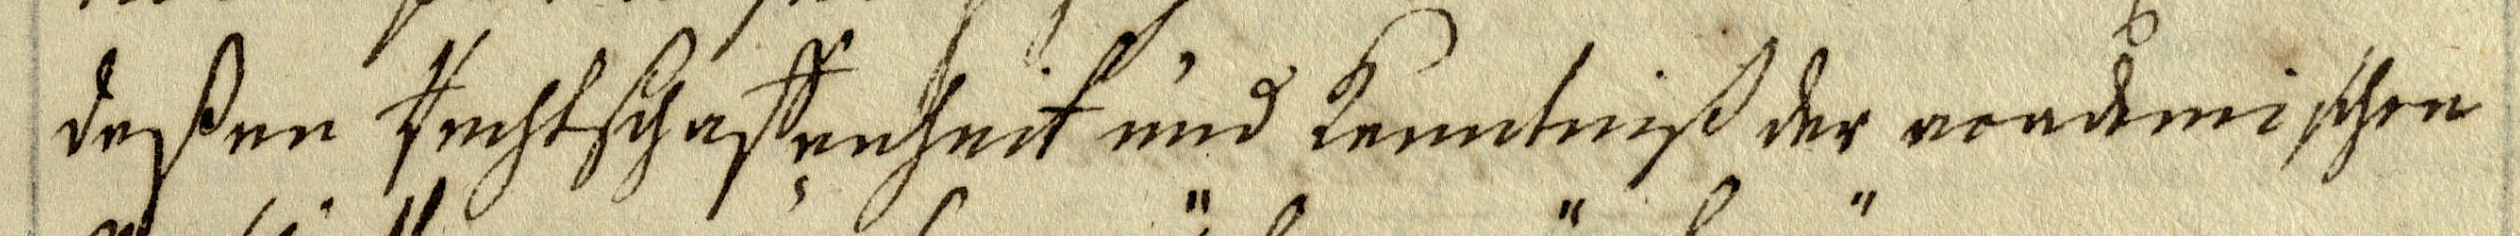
dessen Rechtschaffenheit und Kenntniß der academischen
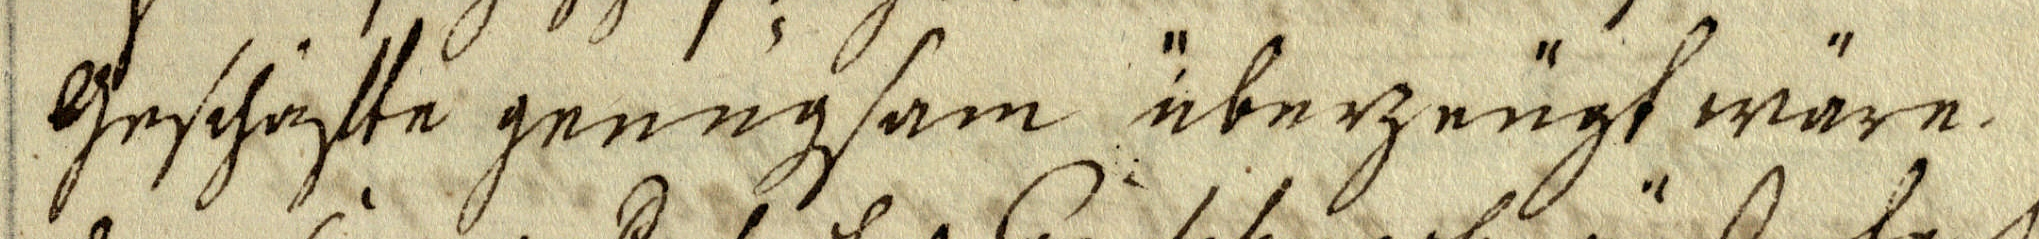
Geschäfte genügsam überzeugt überzeugt wäre
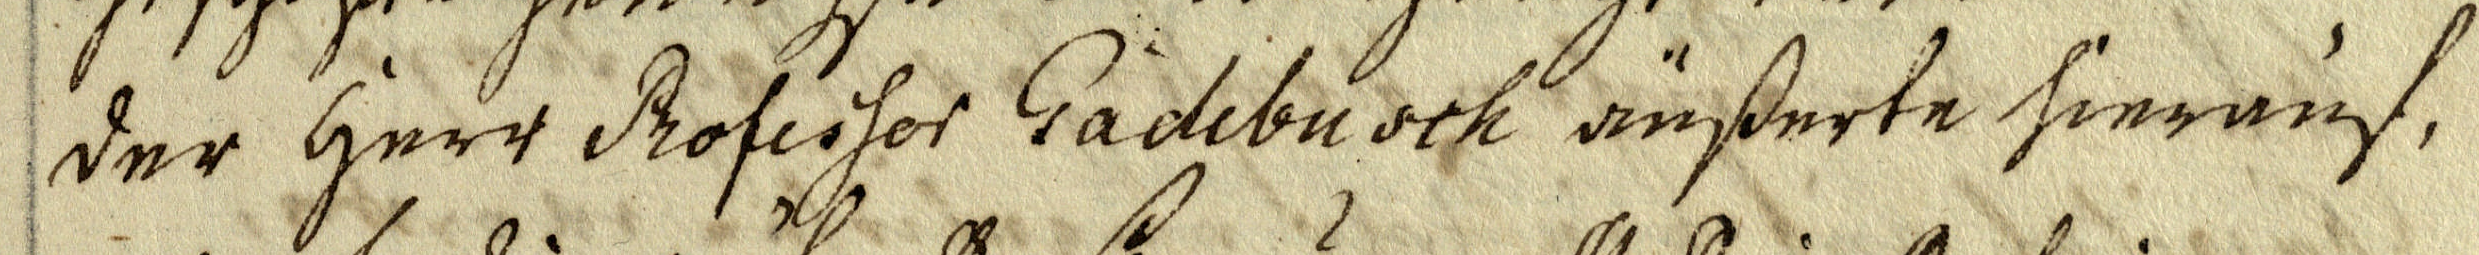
DerHerr ProfessorGadebusch äußerte hierauf,
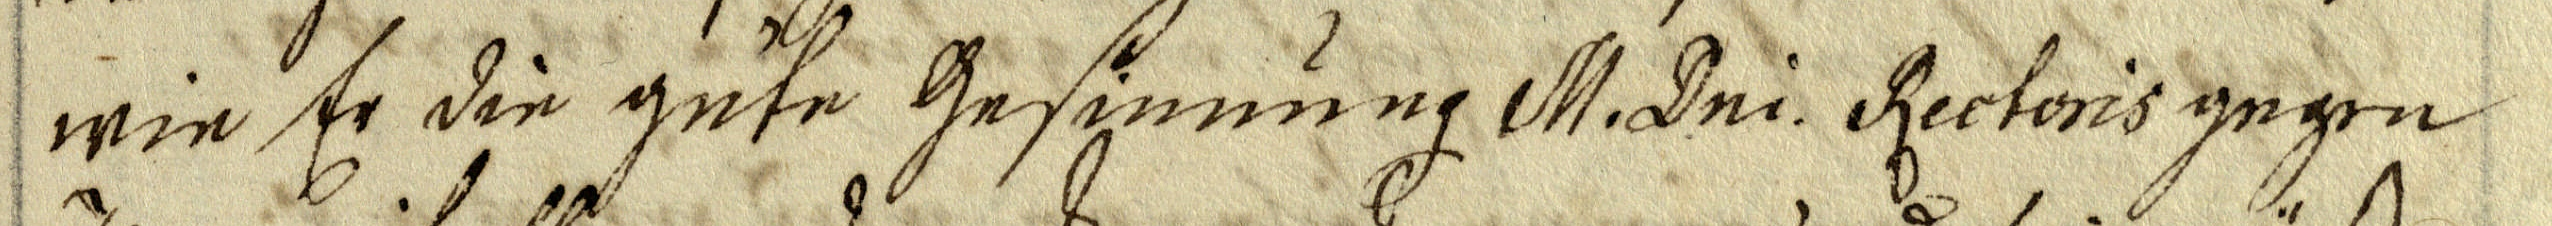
wie Er die gute Gesinnung M. D. Rectoris gegen
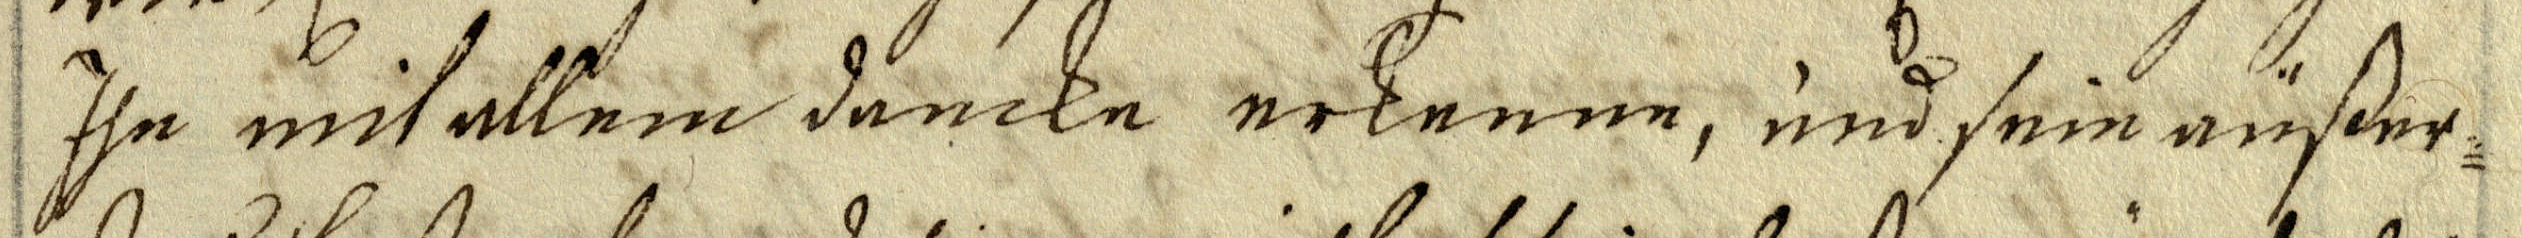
Ihn mit allem dancke erkenne, und sein äußer¬
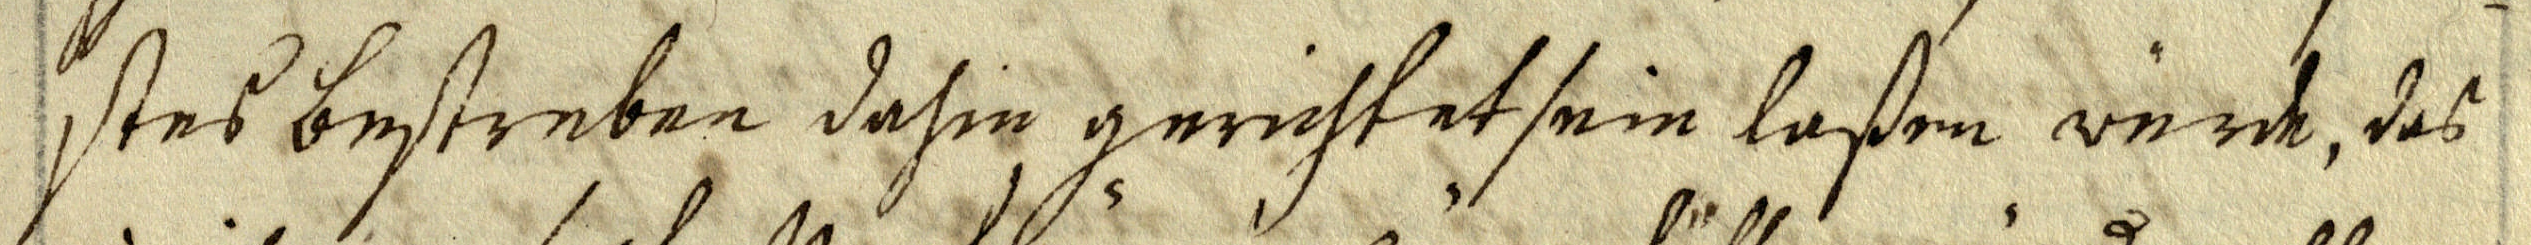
stes Bestreben dahin gerichtet sein laßen würde, das
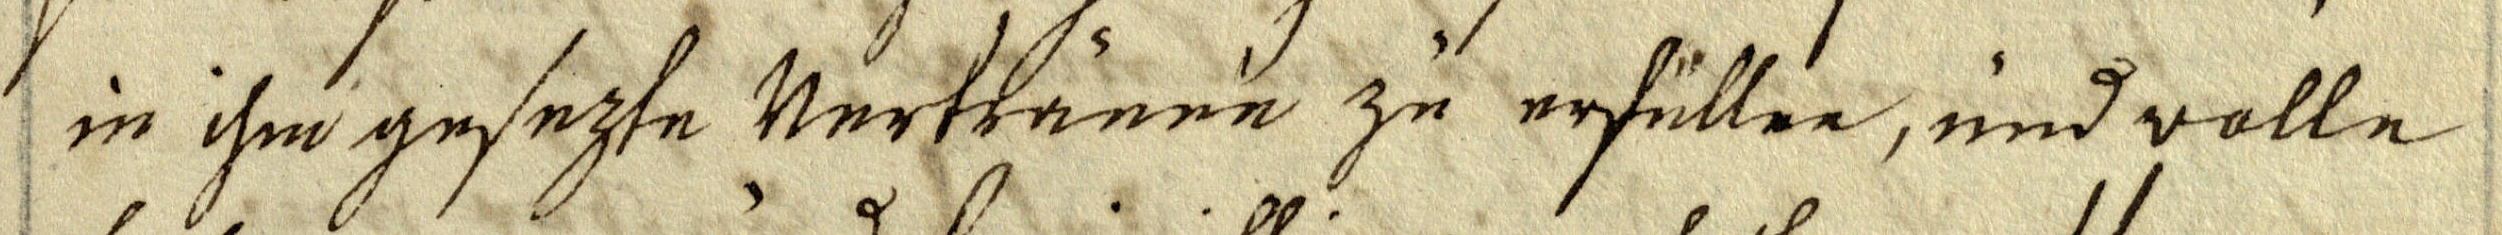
in ihm gesezte Vertrauen zu erfüllen, und wolle
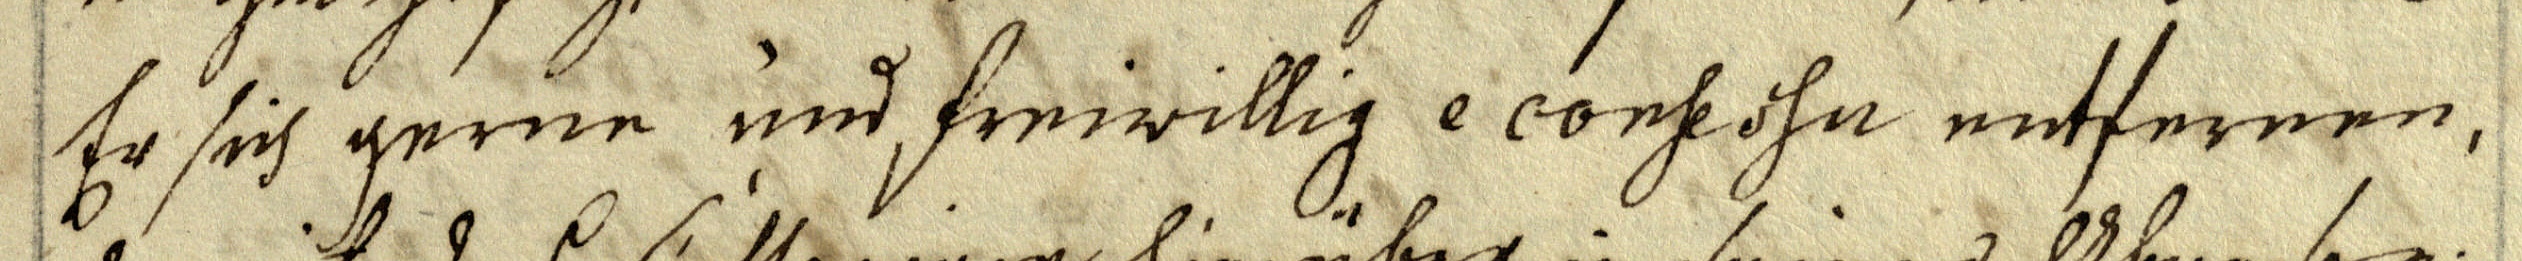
Er sich gerne und freiwillig e consessu entfernen,
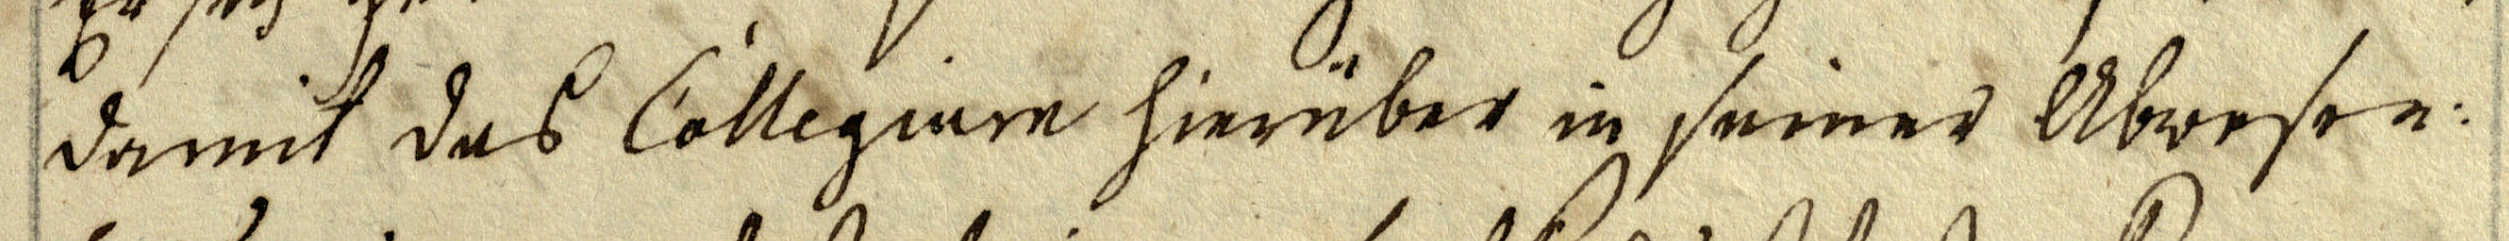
damit das Collegium hierüber in seiner Abwesen¬
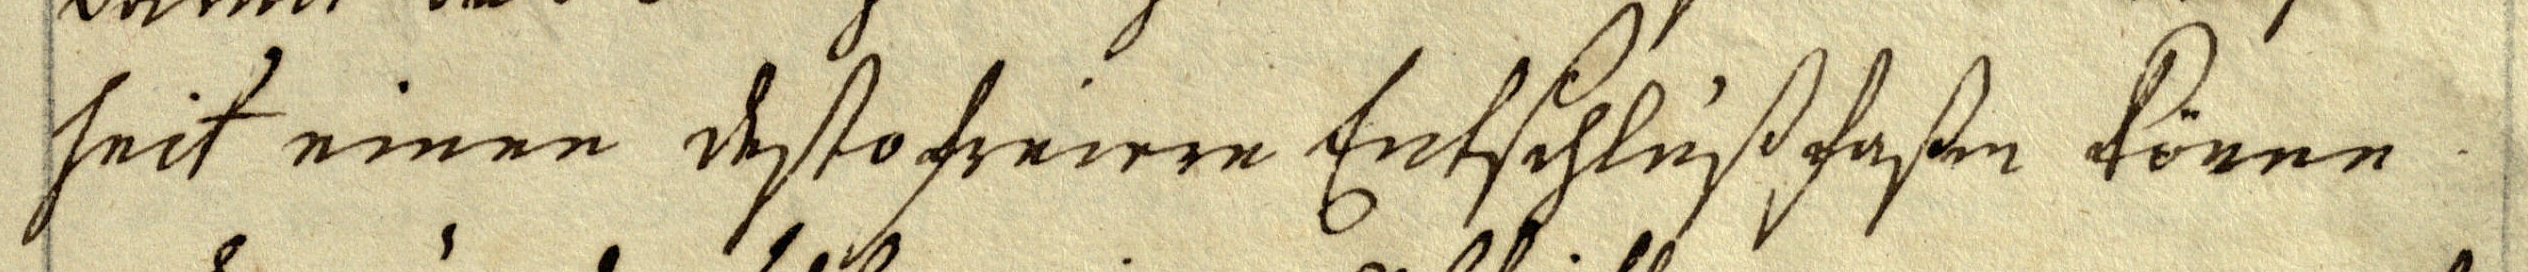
heit einen dest freiern Entschluß fassen könne.
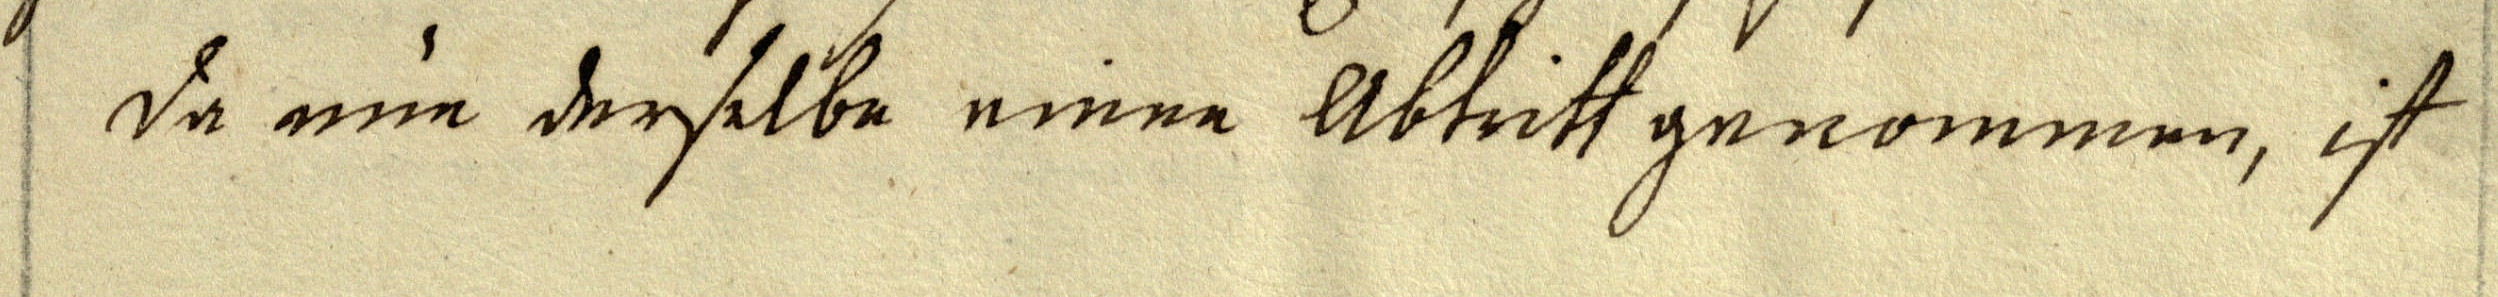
da nun derselbe einen Abtritt genommen, ist
